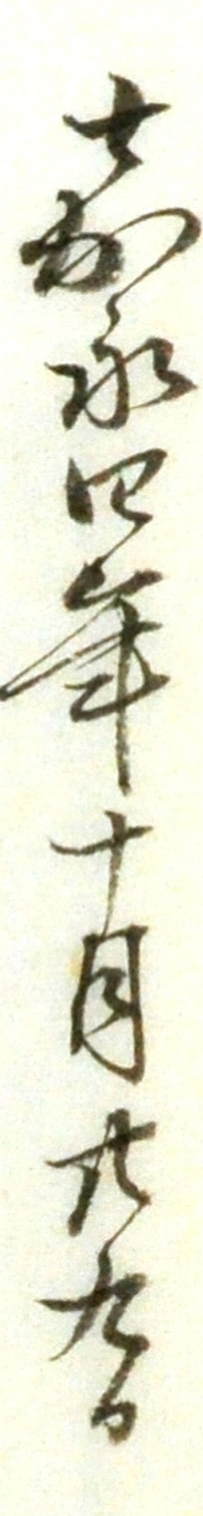嘉永四年十月廿九日
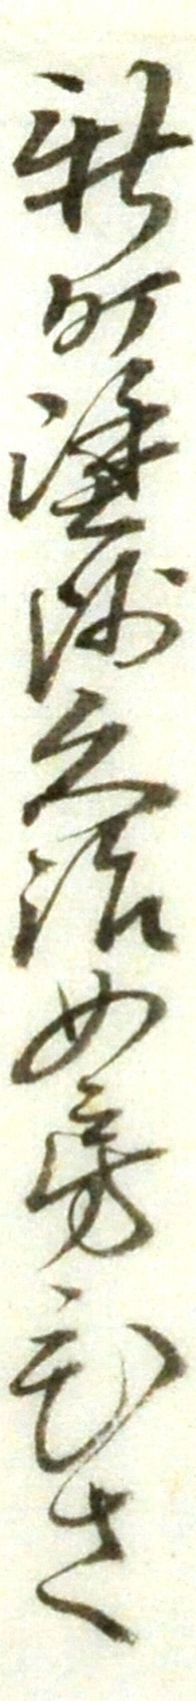新町塗政久治女房ひさ
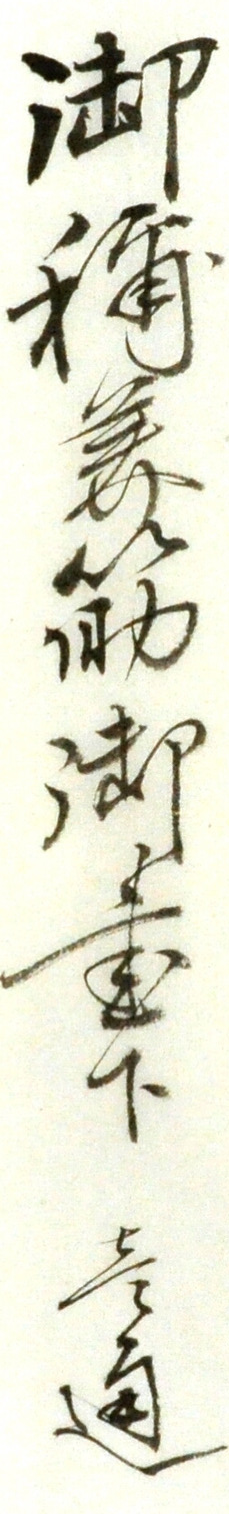御称美筋御書下壱通

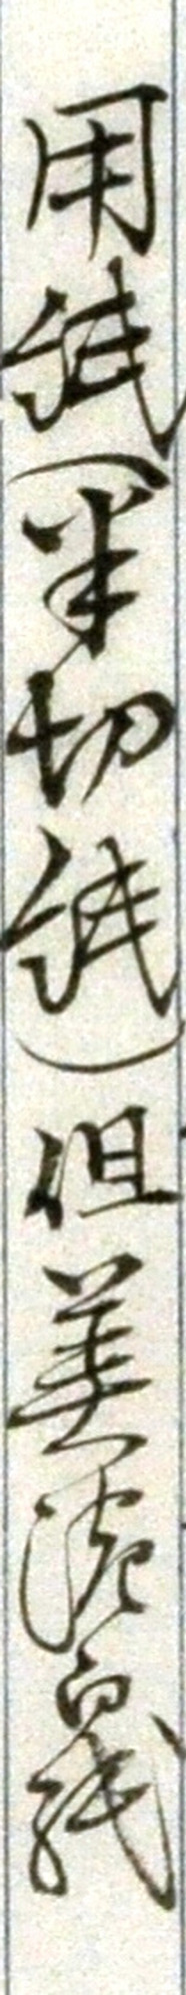用紙(半切紙)但美濃白紙
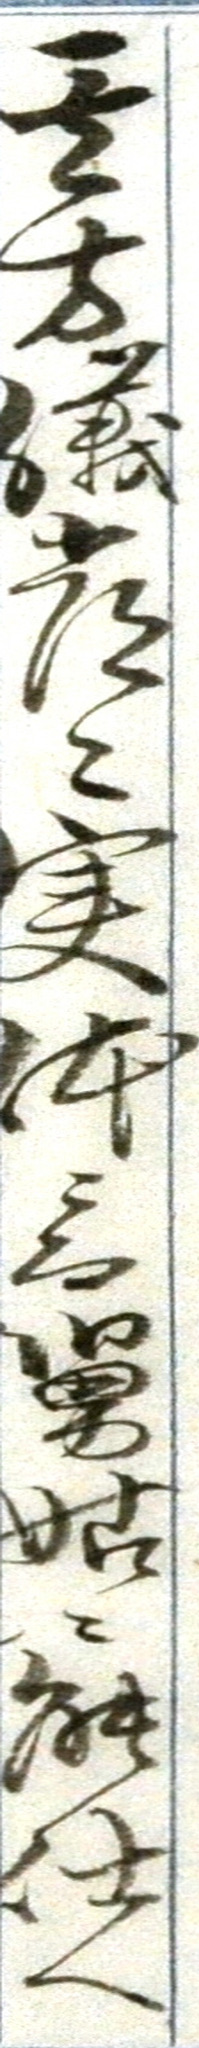其方儀常々実体ニ而舅姑ニ能仕へ
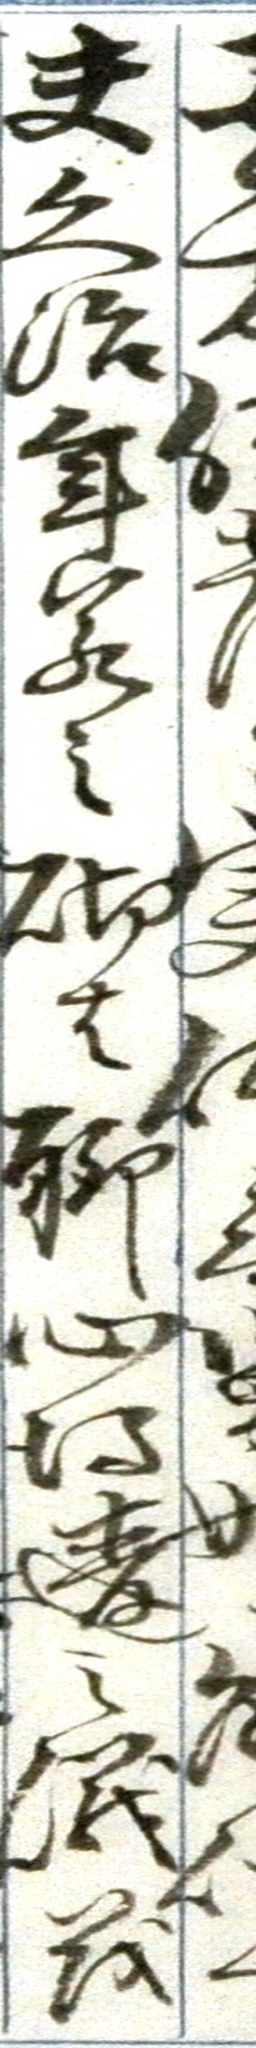夫久治年若之砌者聊心得違之儀茂
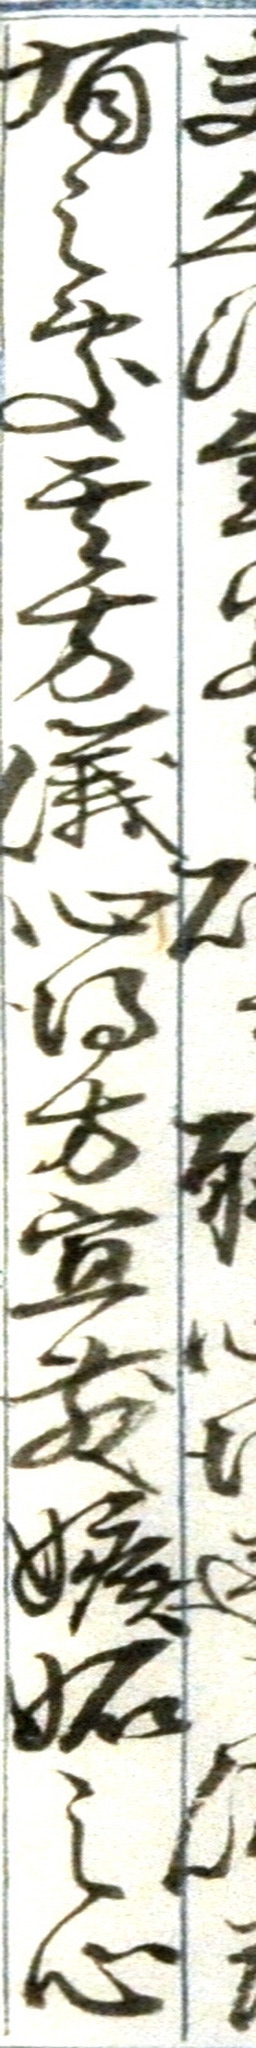有之処其方儀心得方宜敷嫉妬之心

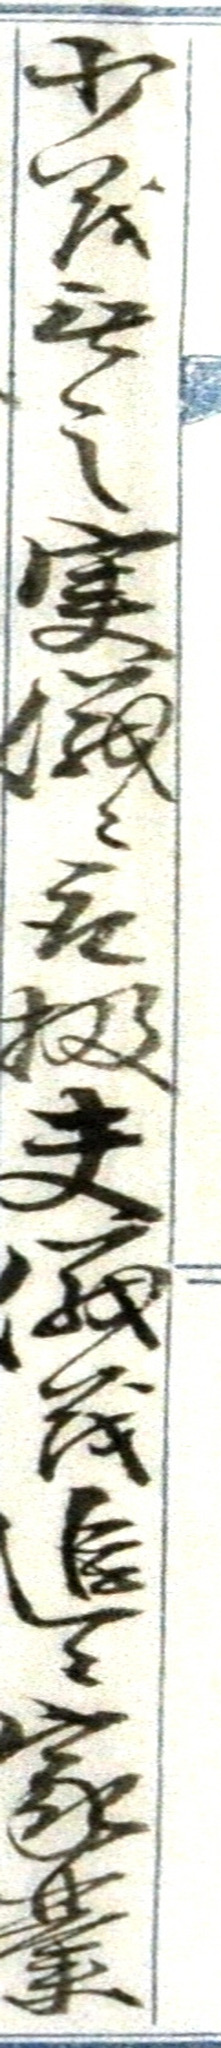少茂無之実儀ニ取扱夫儀茂追々家業
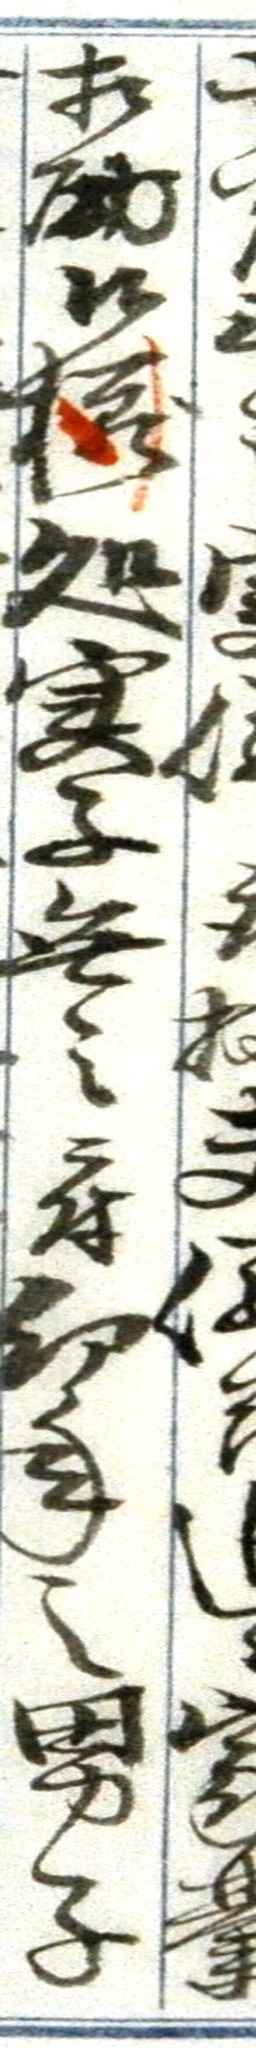相励候様処実子無之ニ付幼年之男子
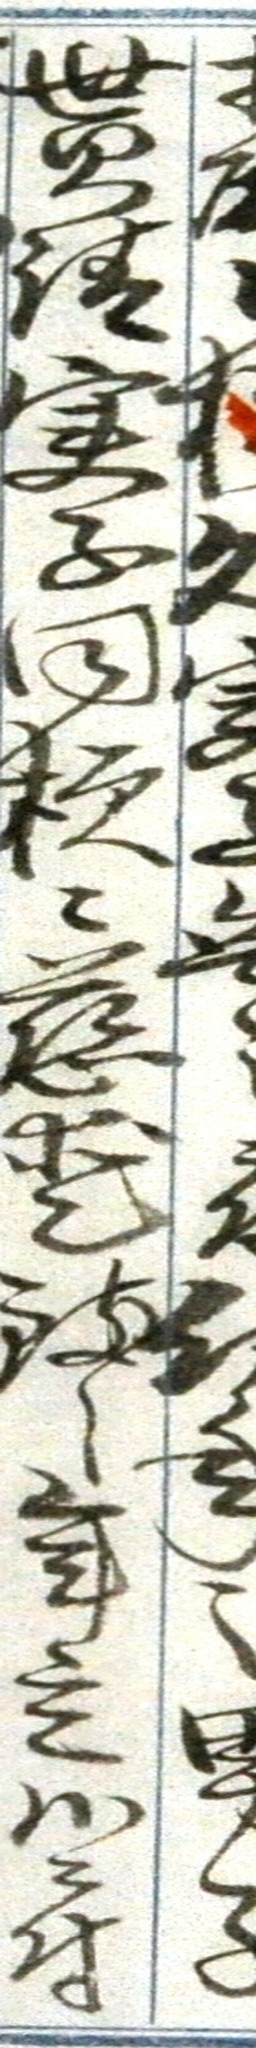貰請実子同様ニ慈愛致し年立候ニ付
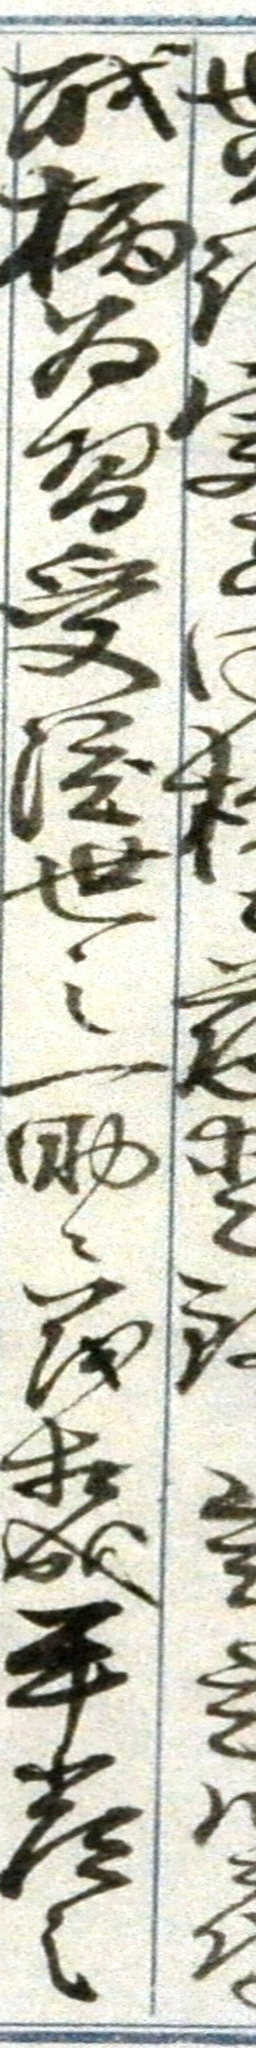職柄為習受渡世之一助ニ茂相成平常之
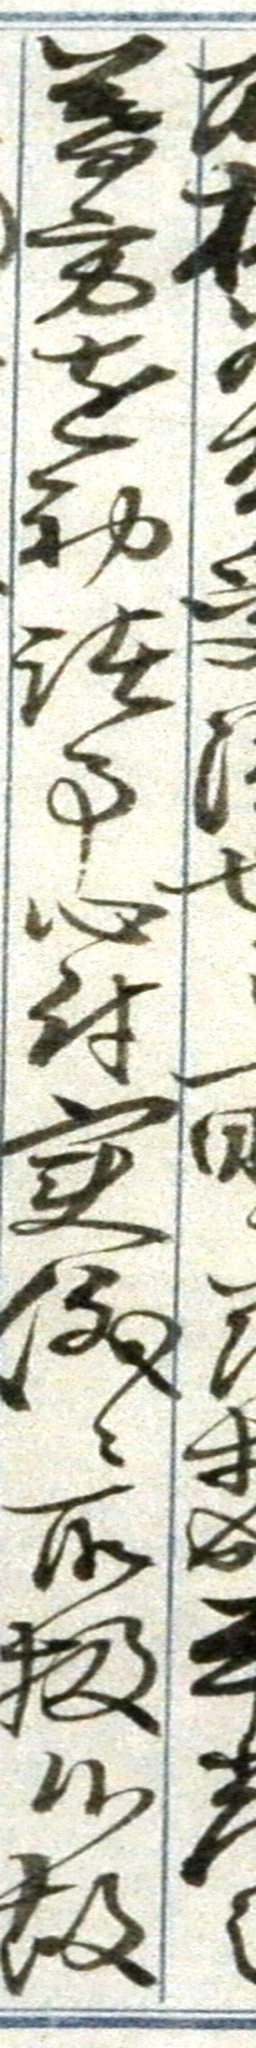暮方を初談事心付実儀ニ取扱候故
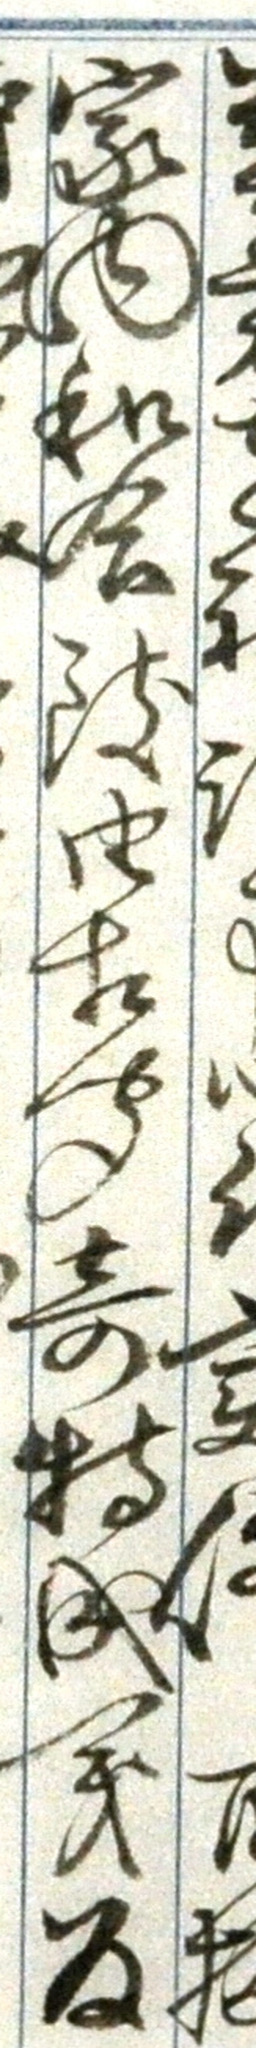家内和合致由相聞奇特成義為
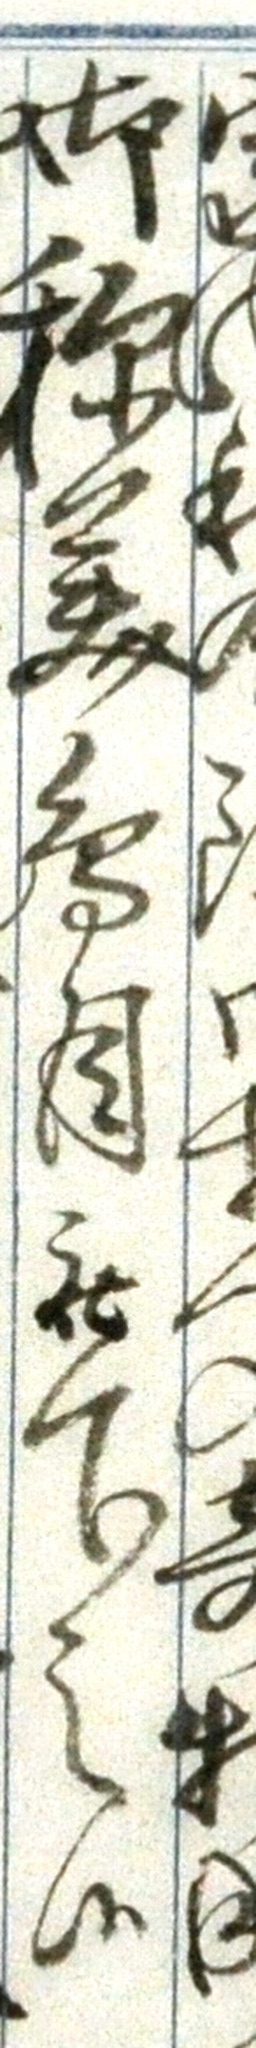御称美鳥目被下之候
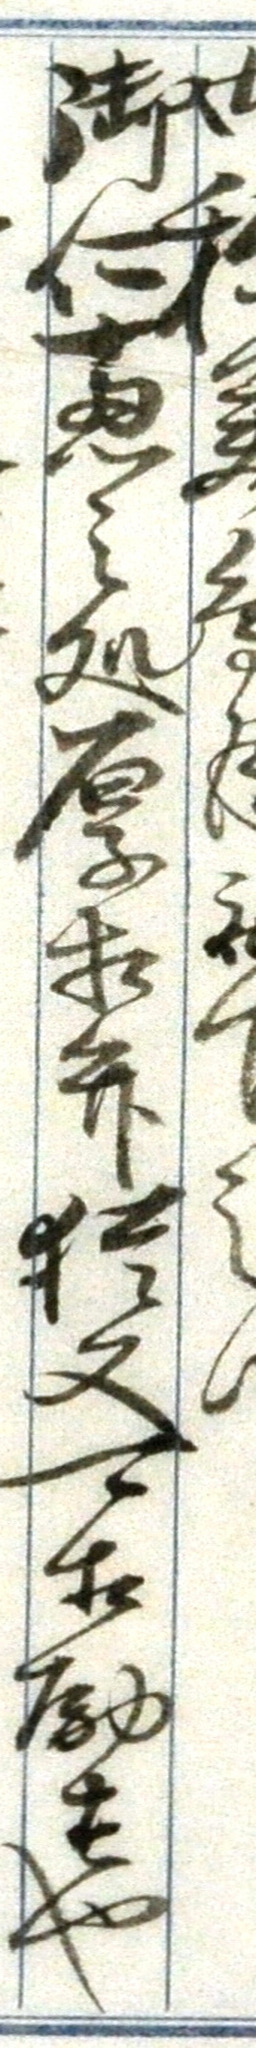御仁恵之処厚相弁猶又可励者也
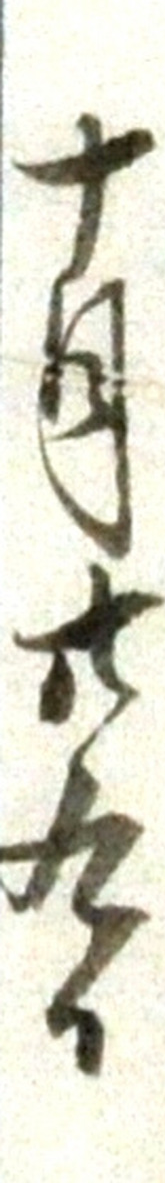十月廿九日
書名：御称美筋御書下
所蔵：伊那市立高遠町図書館・合同会社AMANE
